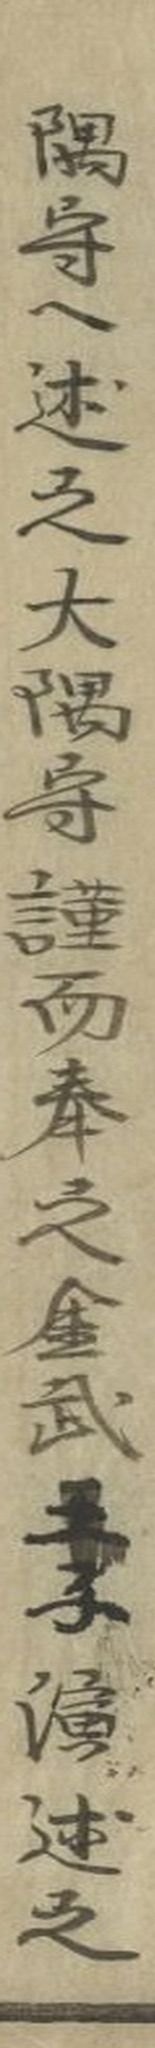隅守へ述之大隅守謹而奉之金武王子演述之
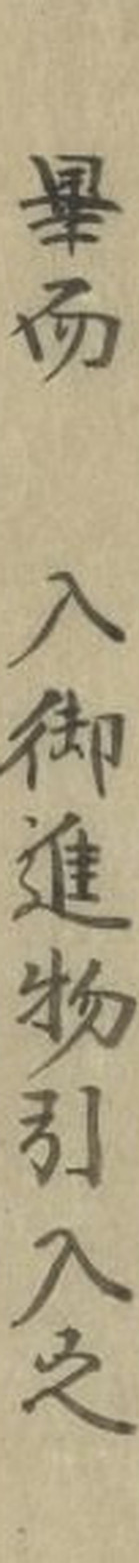畢而入御進物引入之
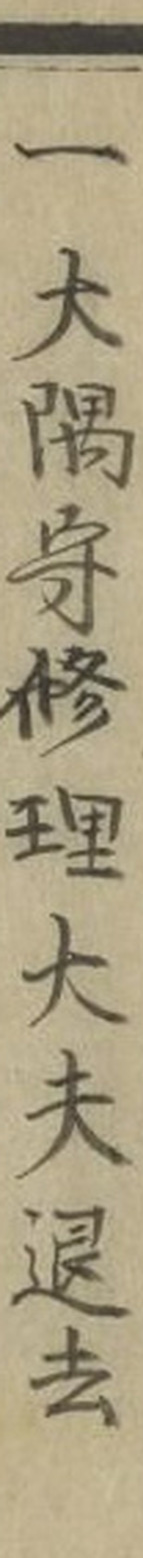一大隅守修理大夫退去
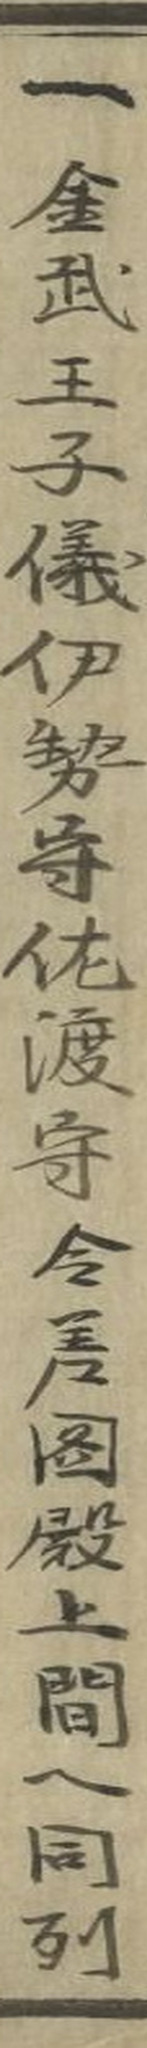一金武王子儀伊勢守佐渡守令差図殿上間へ同列
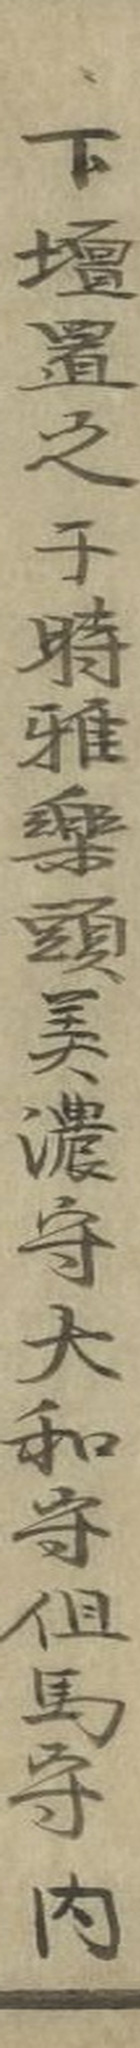下檀置之于時雅楽頭美濃守大和守但馬守内
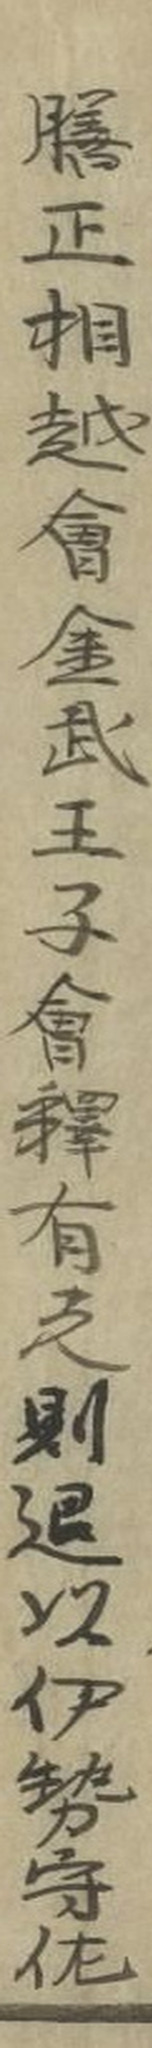膳正相越会金武王子会釈有之則退以伊勢守佐
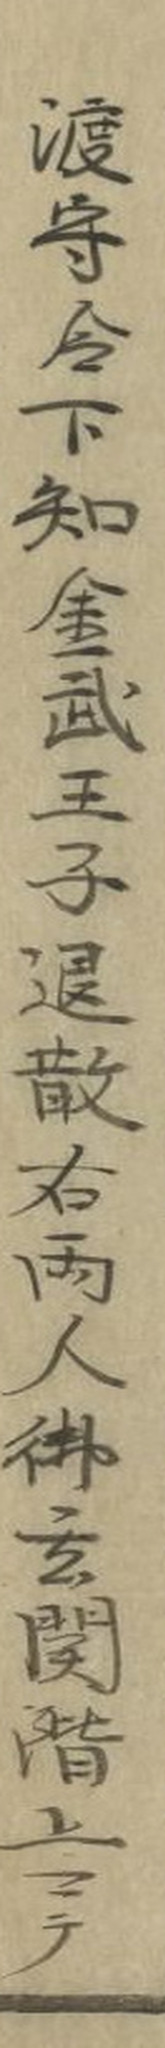渡守令下知金武王子退散右両人御玄関階上マテ
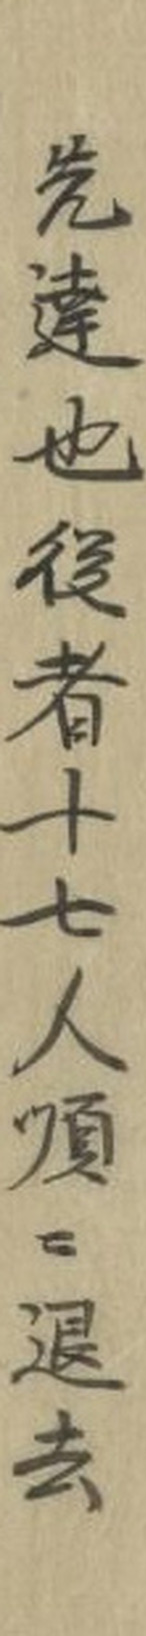先達也従者十七人順二退去
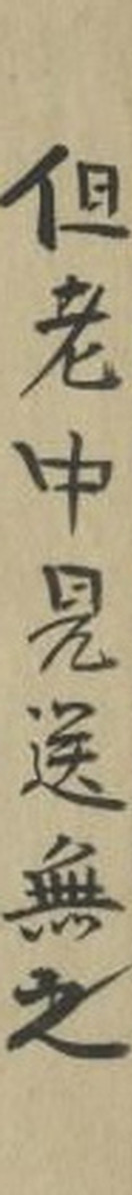但老中見送無之
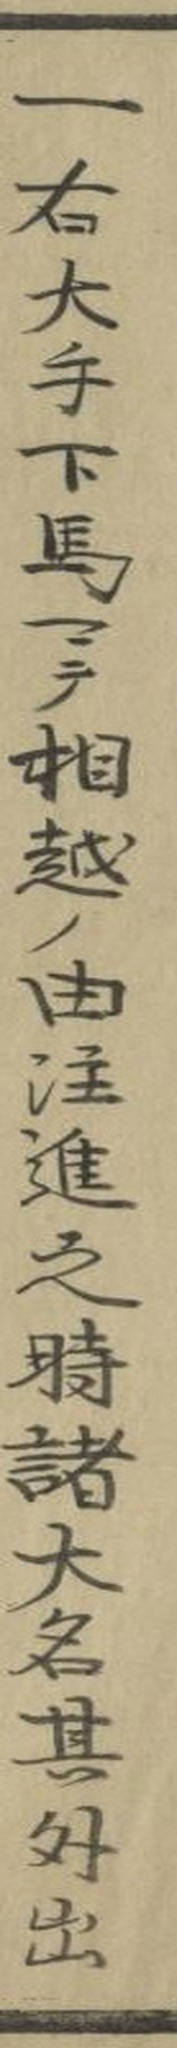一右大手下馬マテ相越ノ由注進之時諸大名其外出
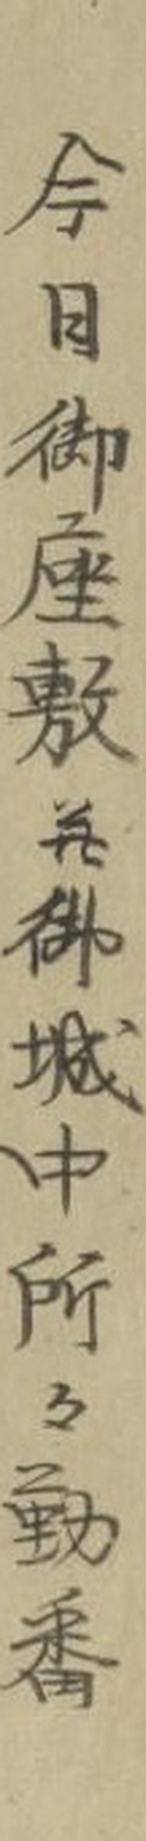今日御座敷幷御城中所どう々勤番
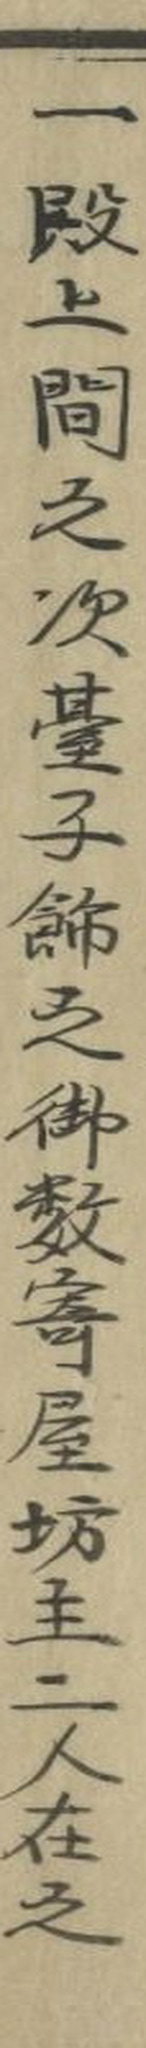一殿上間之次台子飾之御数寄屋坊主二人在之
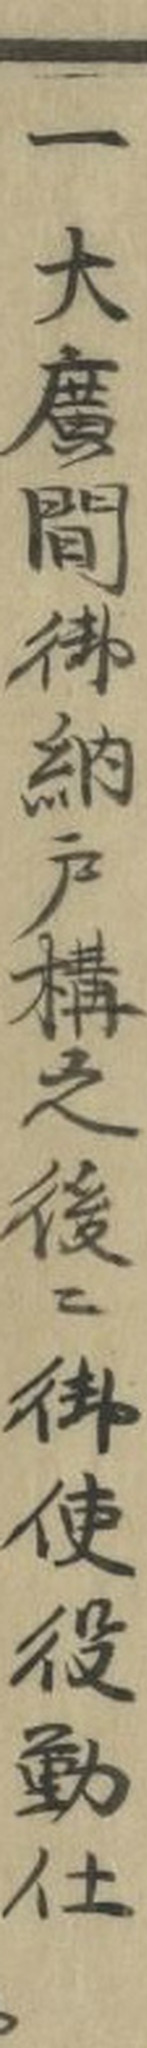一大広間御納戸構之後二御使役勤仕
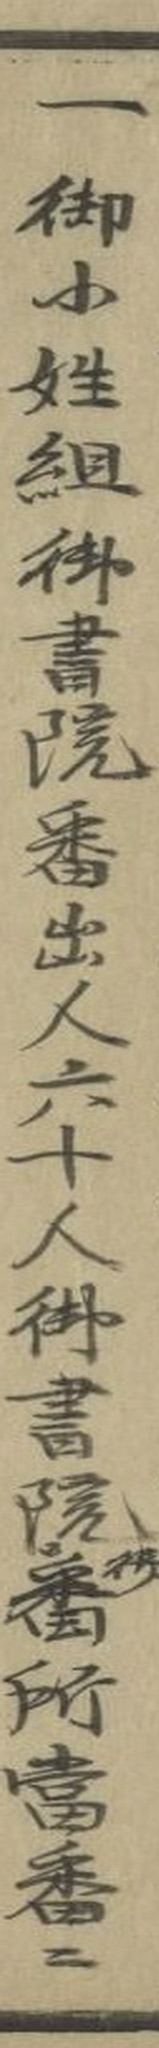一御小姓組御書院番出人六十人御書院御番所当番二
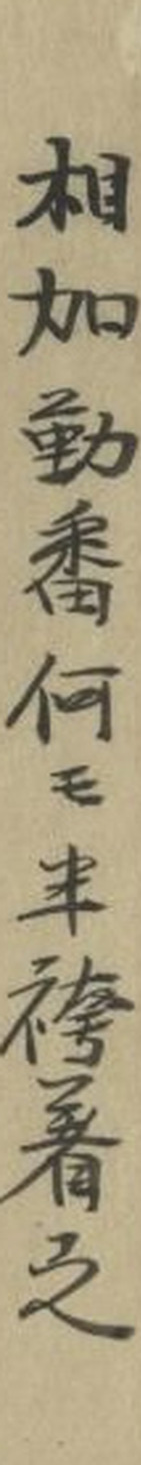相加勤番何モ半袴着之
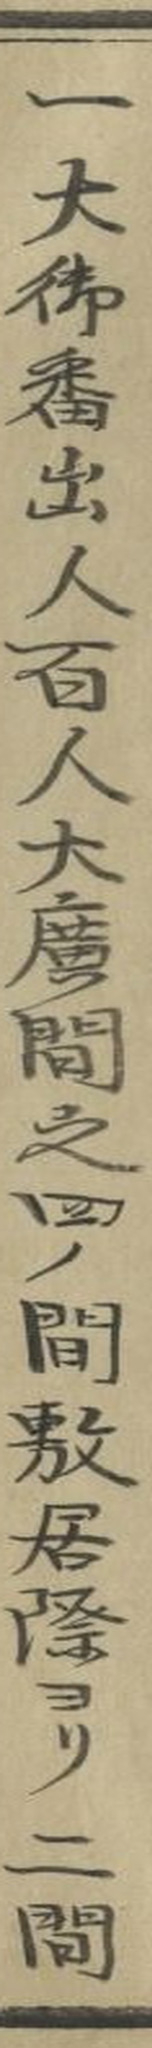一大御番出人百人大広間之四ノ間敷居際ヨリ二間
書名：琉球往来（下）
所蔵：University of the Ryukyus Library
